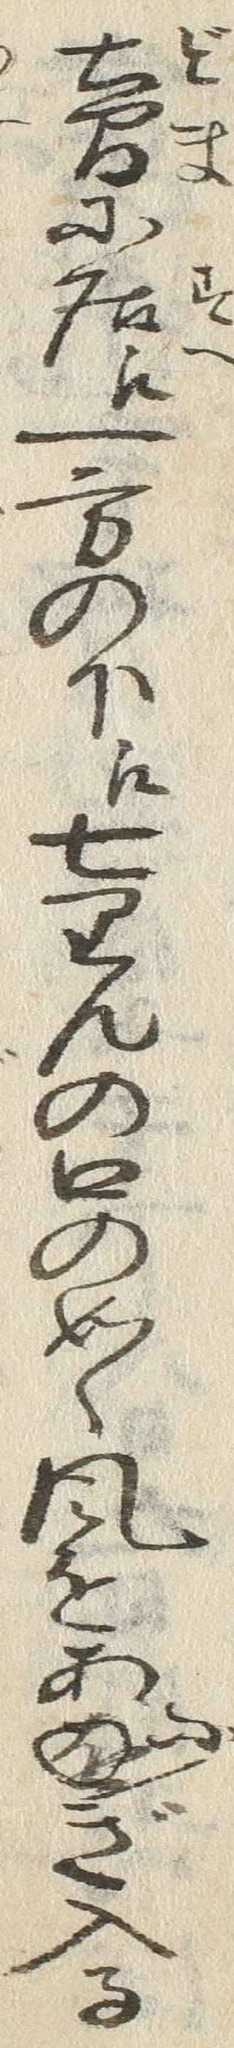土間尓居江一方の下江七里んの口の如く風をあふぎ入る
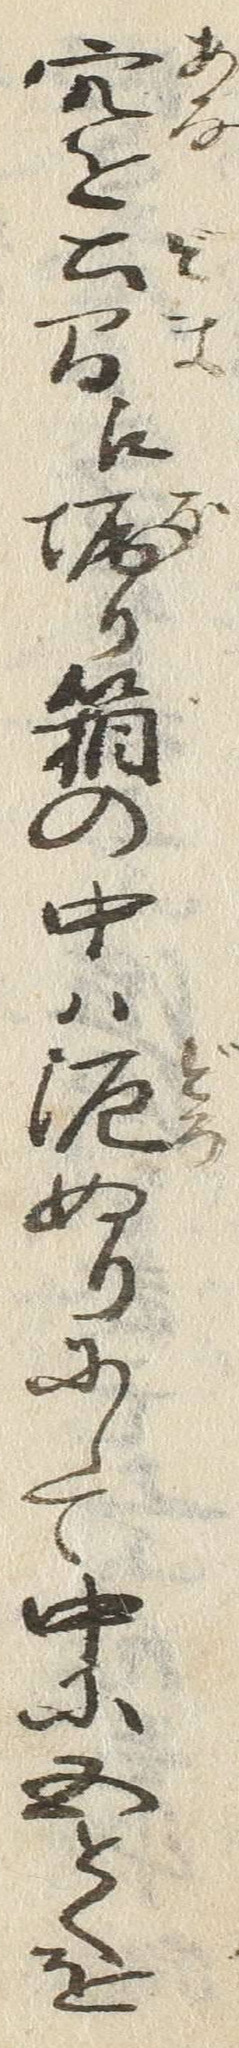穴を土間江堀り箱の中は泥ぬり尓して中尓五とくを
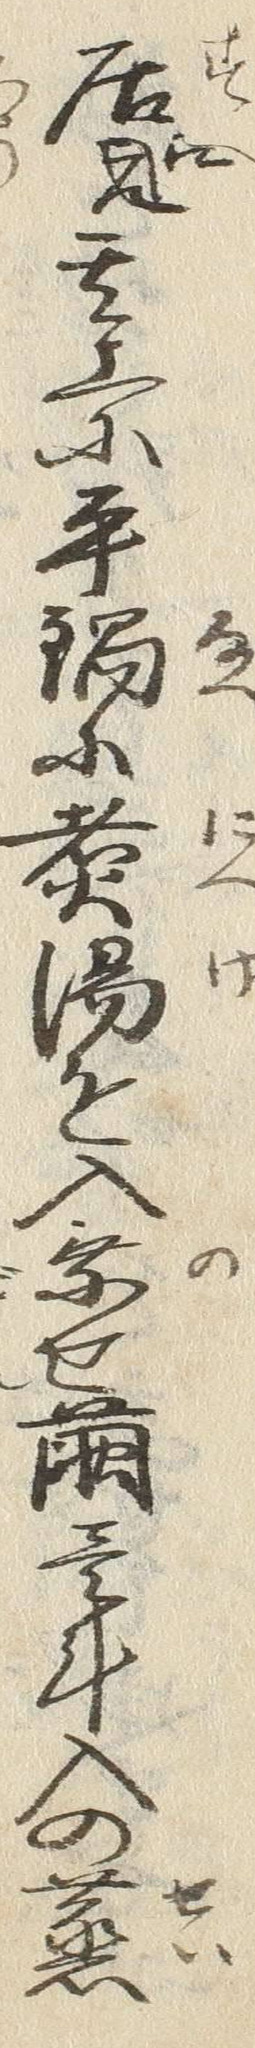居江其上尓平鍋尓煮湯を入乗せ繭壱斗入の蒸
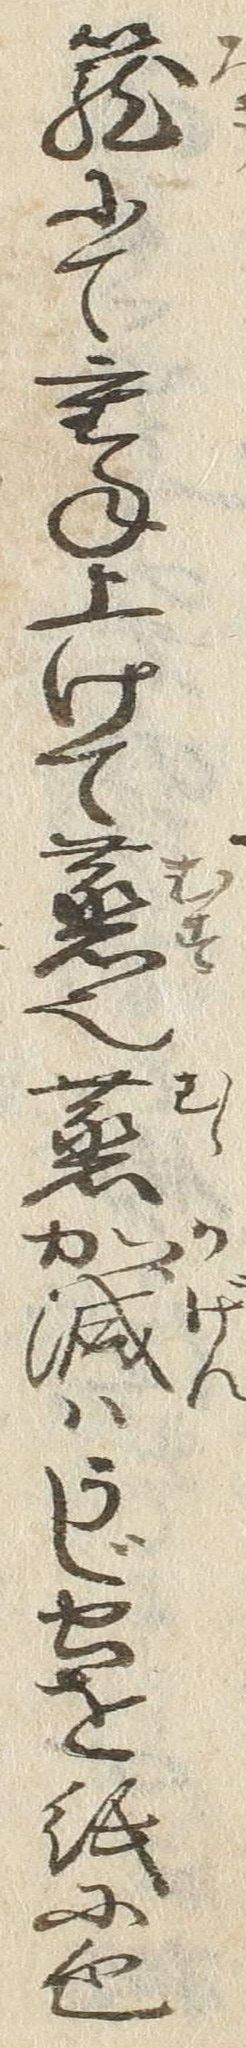籠尓て重年上げて蒸也蒸加減はうじ虫を紙尓包
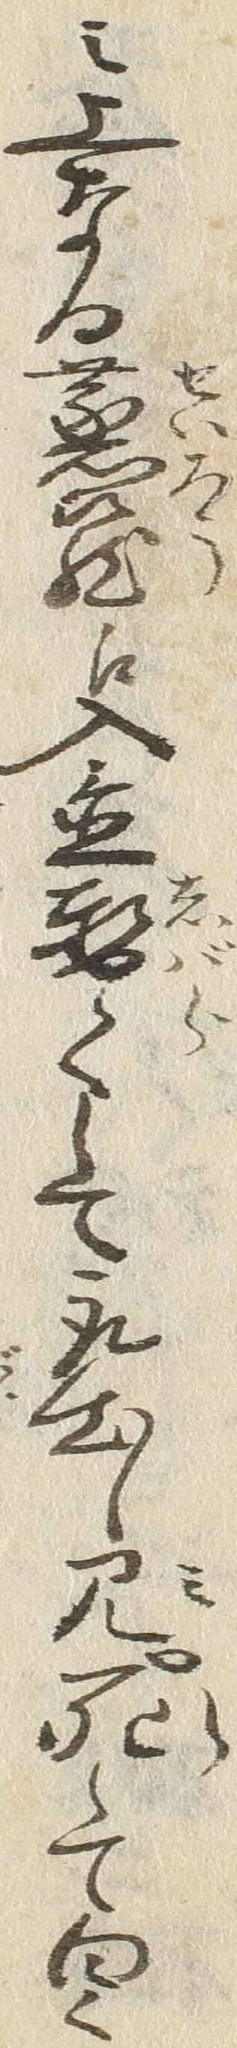み上なる蒸籠江入置暫くして取出し見。死して白く
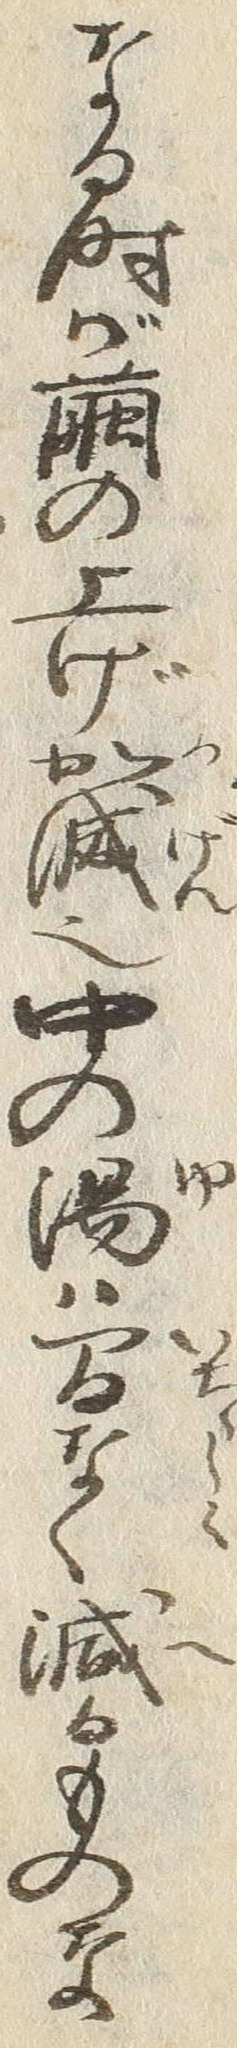なる時が繭の上げ加減也中の湯は間なく減るものな
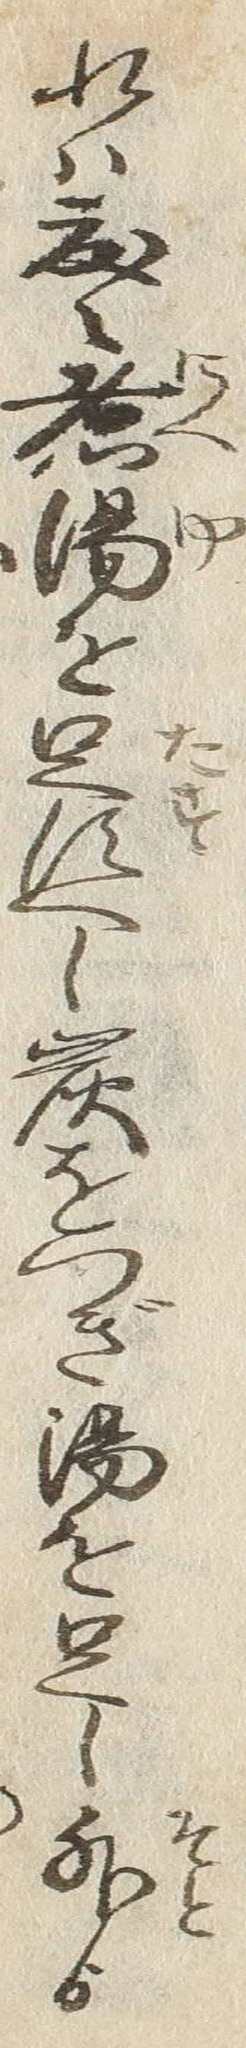れは度々煮湯を足須へし炭をつぎ湯を足し外ゟ
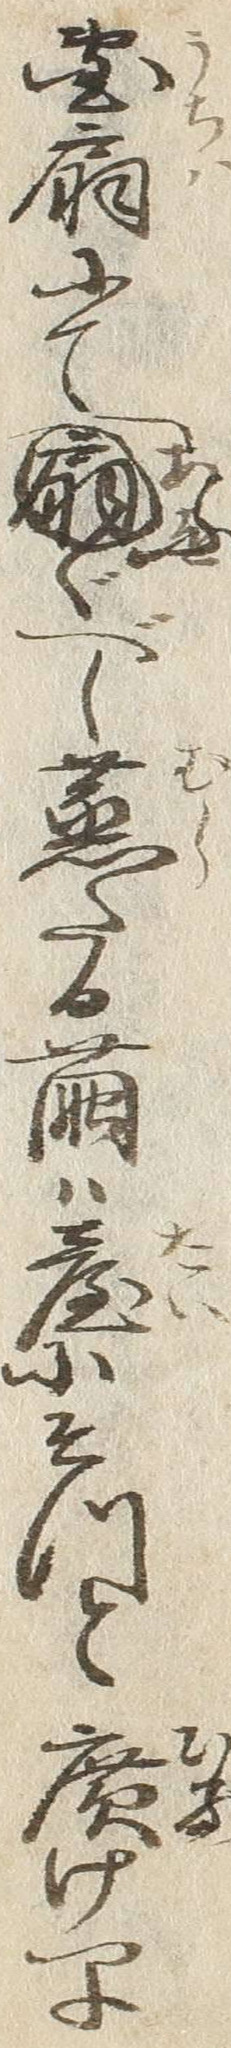団扇尓てあふぐべし蒸たる繭は臺尓そ川と廣げ早
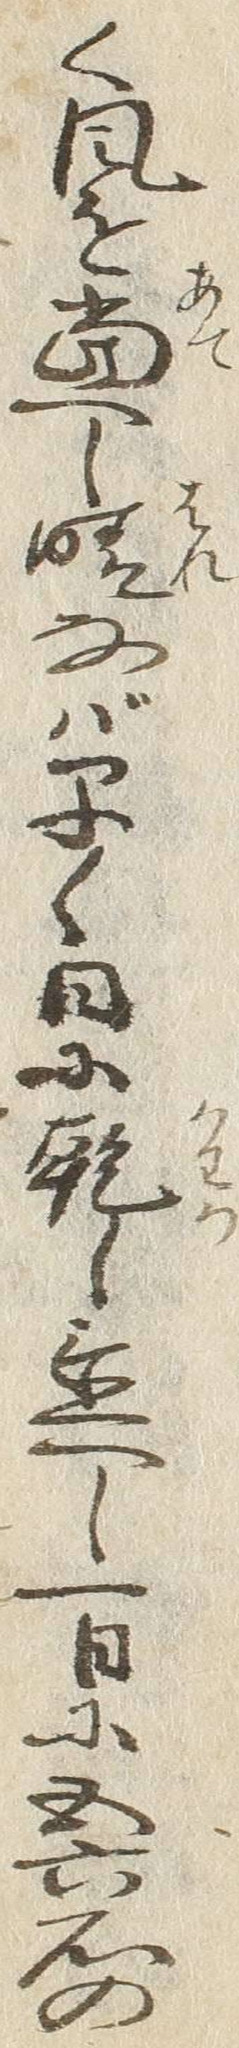く風を当へし晴なば早く日尓乾し置へし一日尓五六石の
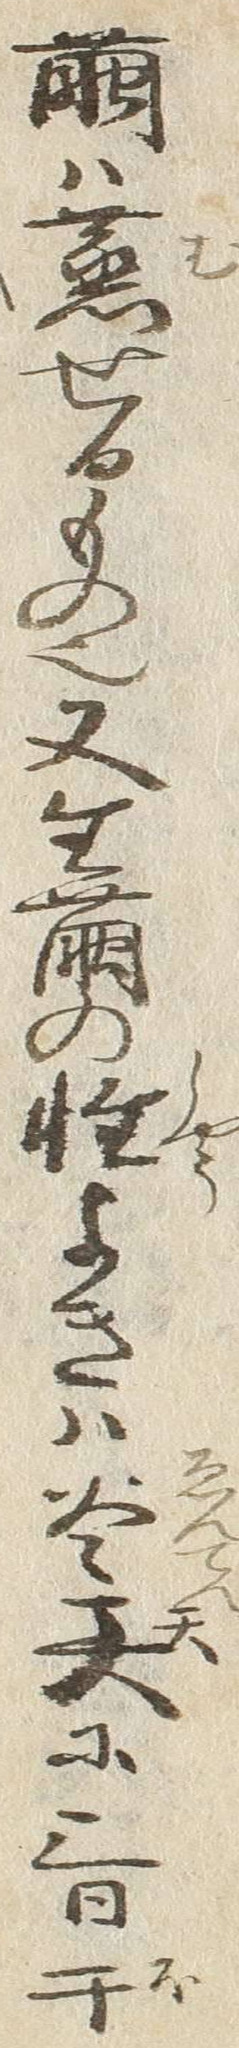繭は蒸せるもの也又生繭の性よきは炎天尓三日干
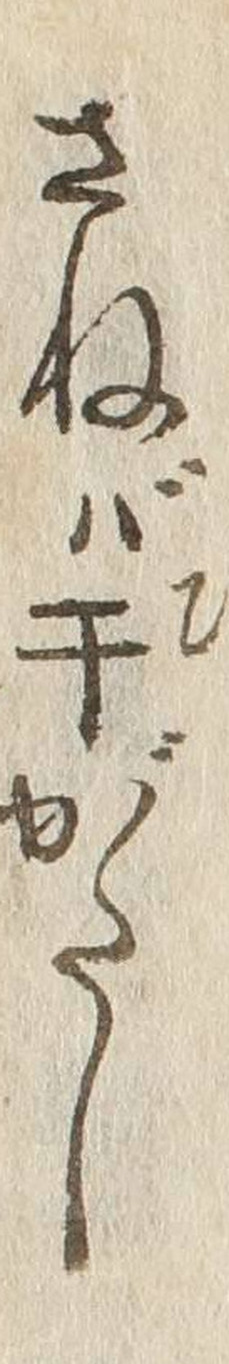さねば干がたし
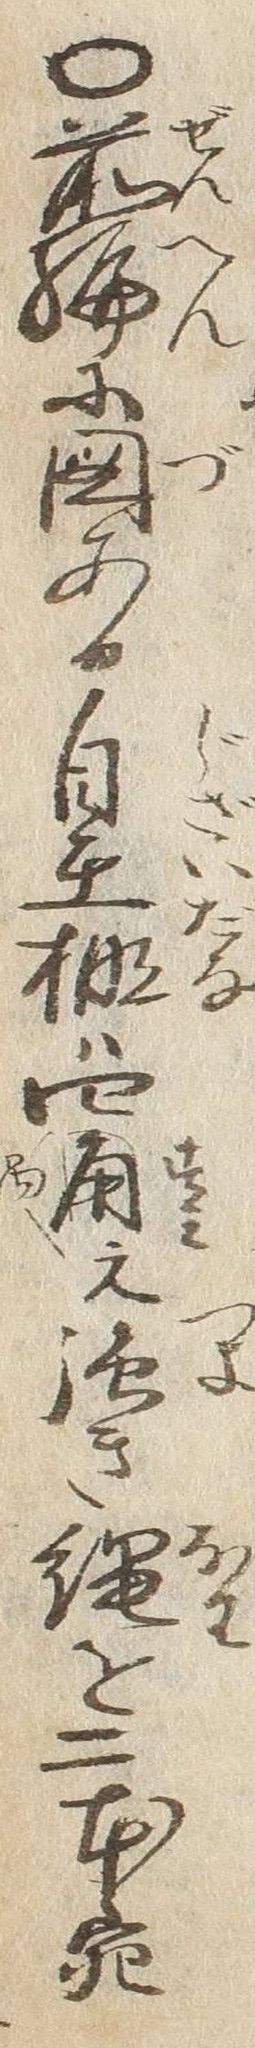〇前編尓図ある自在棚は四隅え強き縄を二本宛

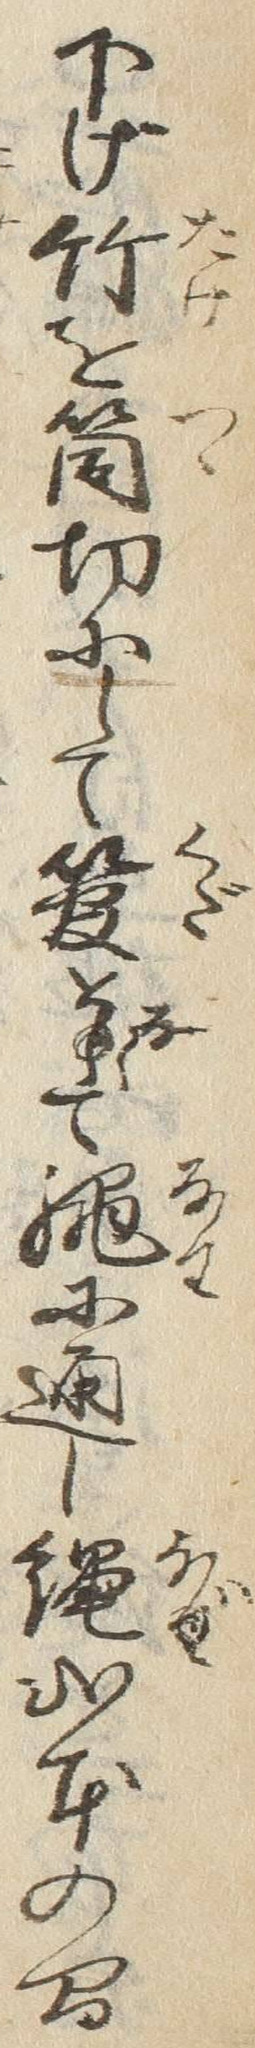下げ竹を筒切尓して管となして縄尓通し縄弐本の間
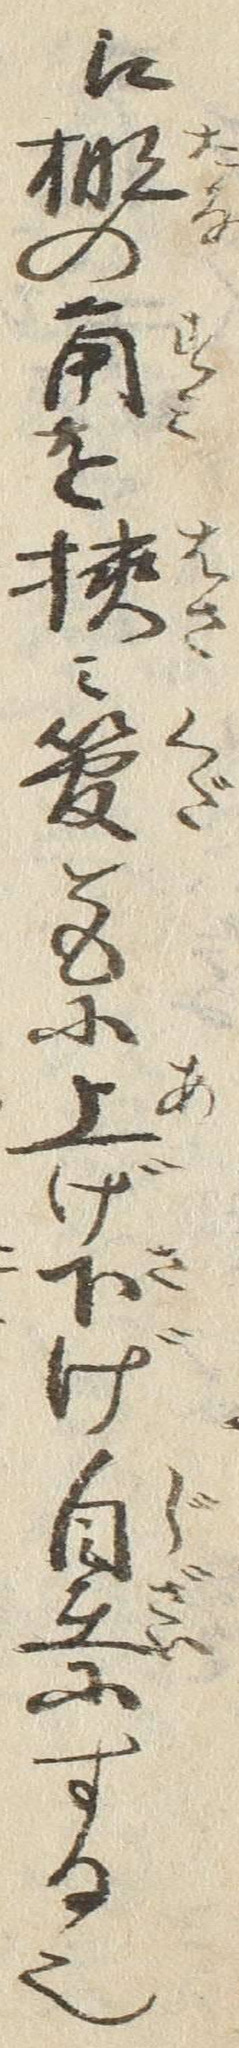江棚の角を挟み管とも尓上げ下げ自在する也
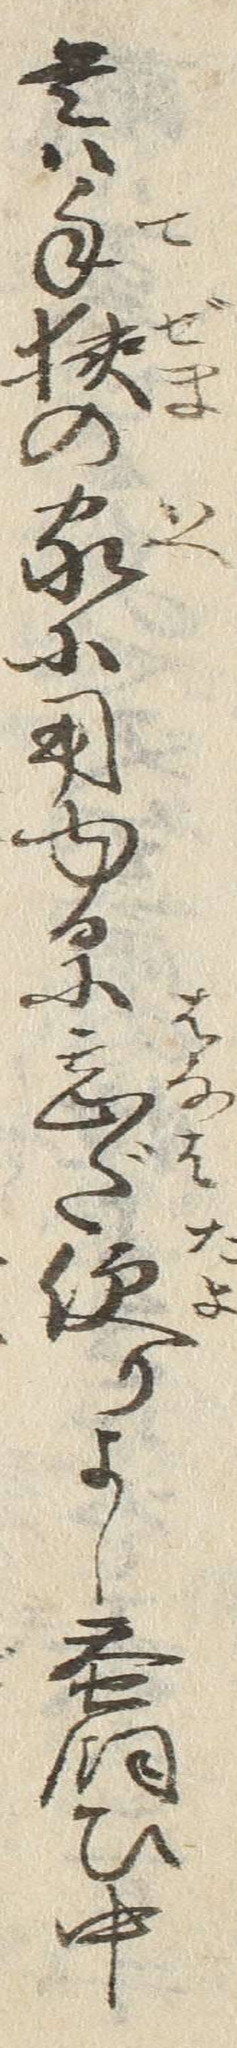是は手狭の家尓用ゆる尓甚だ便りよし蚕飼ひ中
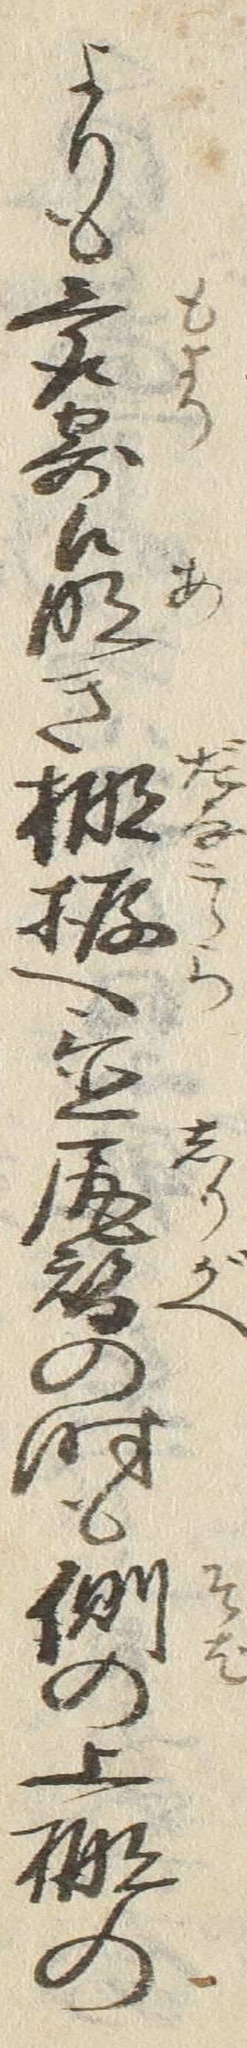よりも最寄江明き棚拵へ置尻替の時も側の上棚の
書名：養蠶實驗録後編
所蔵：東京大学農学生命科学図書館 国文学研究資料館
